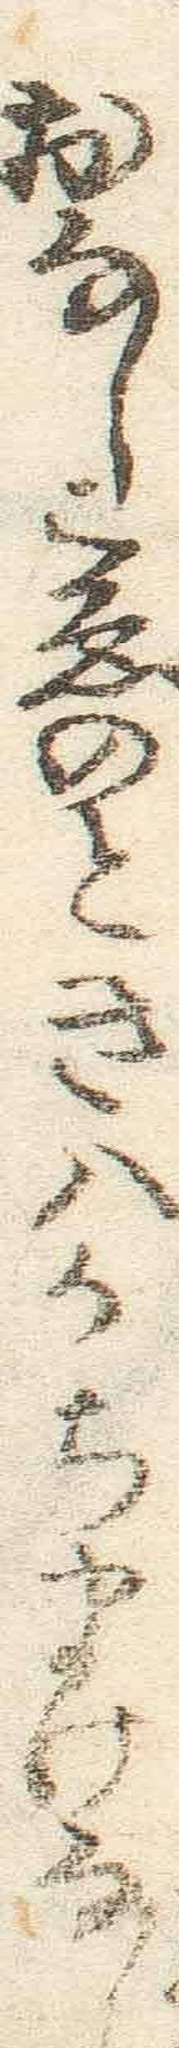おなしこゑのときはかちまけなし
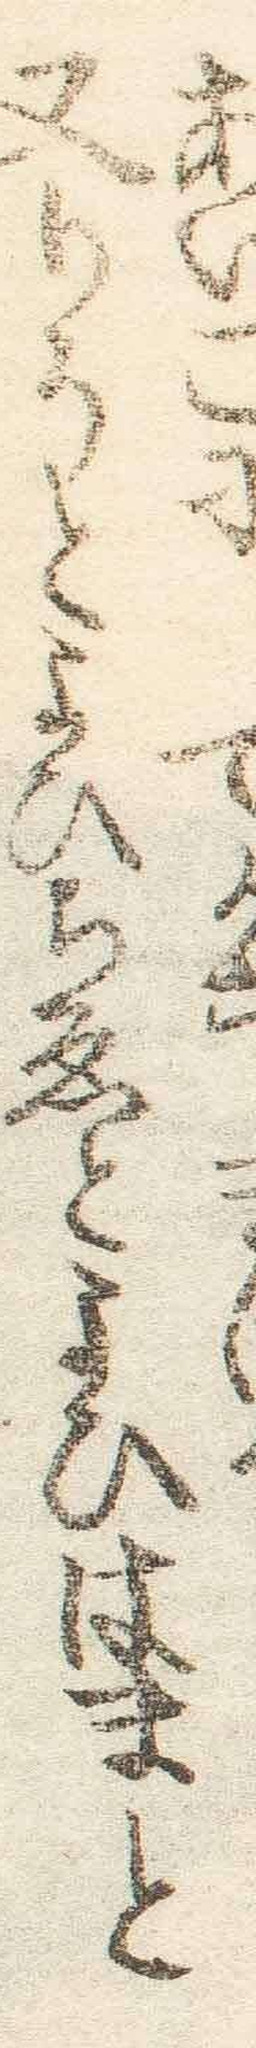又りうとよひちゑとよひはまと
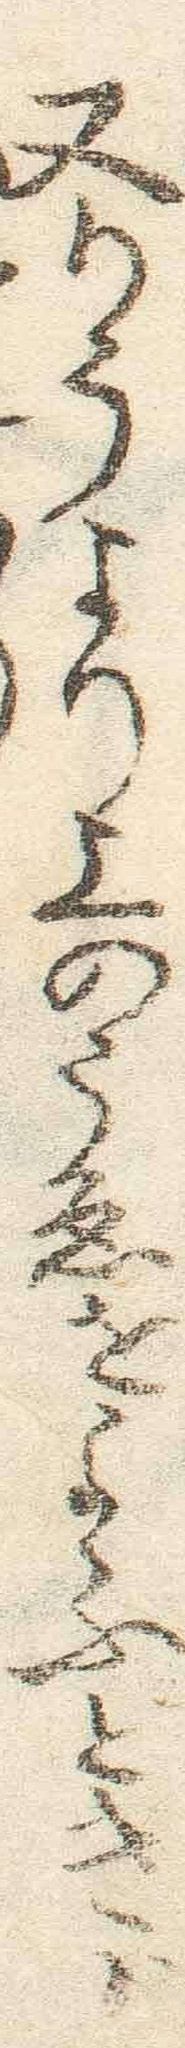又りうより上のこゑをよふときは
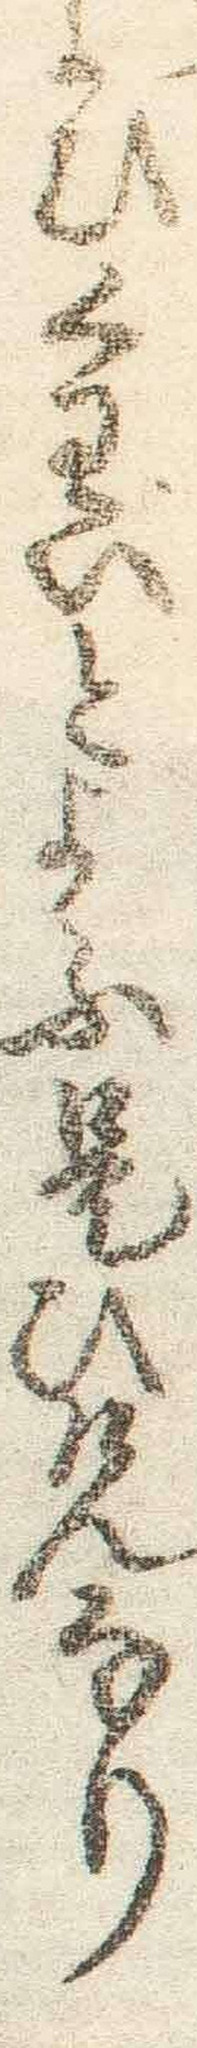よひくわいとよふ是ひけんなり
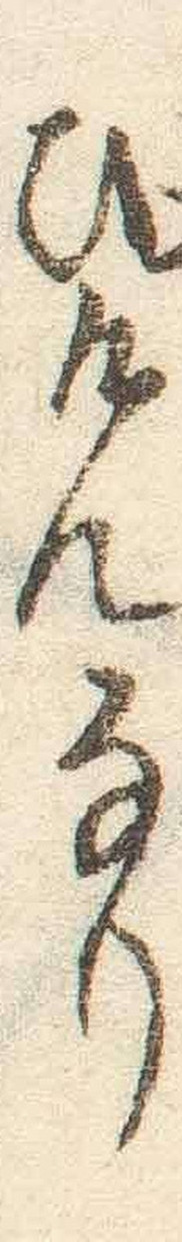ひけんなり

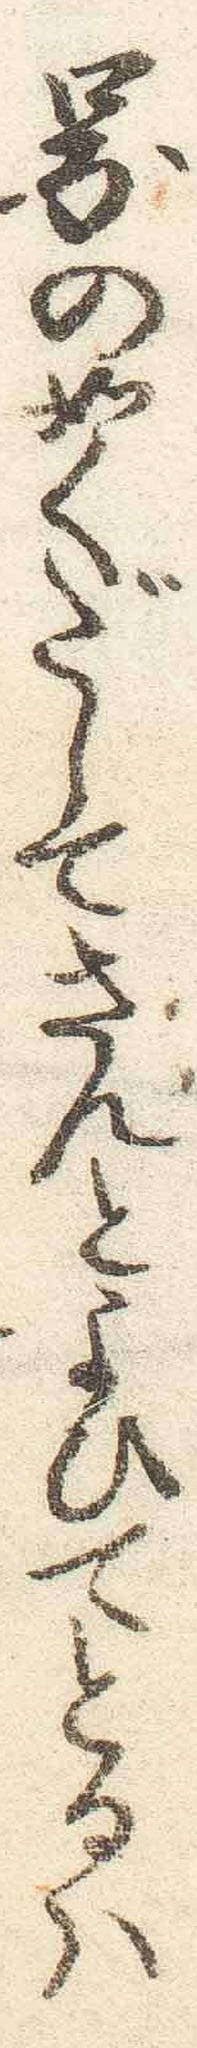図の如くだしてさんとよひてとるは
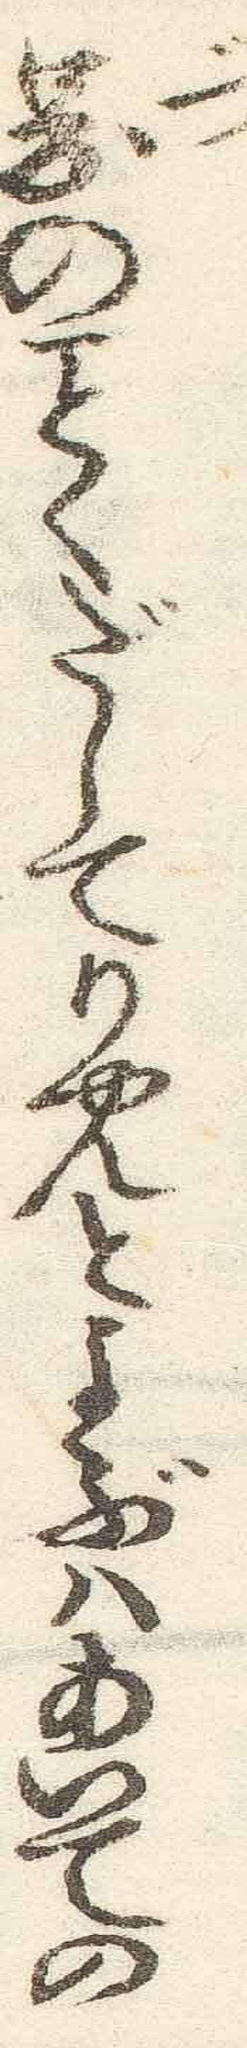図のことくだしてりやんとよぶはあいての
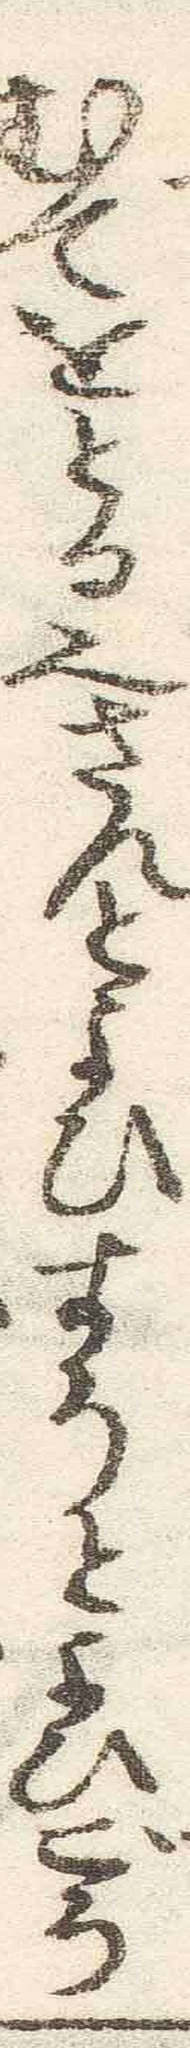むてをとる也さんとよひすうとよひごう
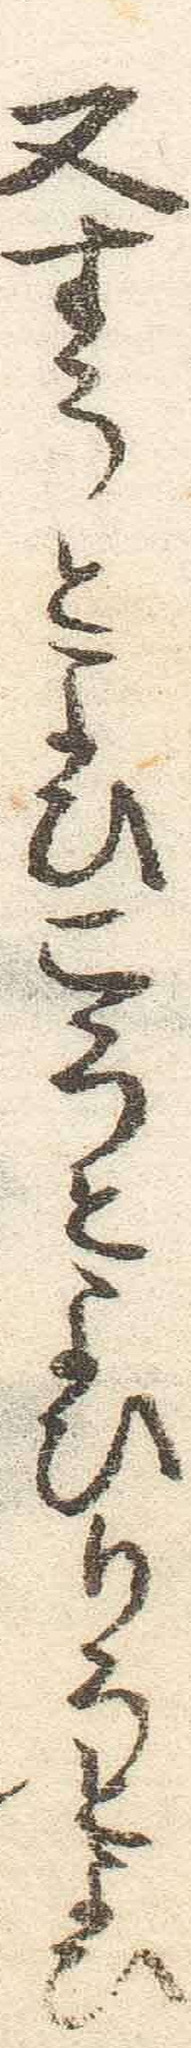又すうとよひこうとよひりうとよひ
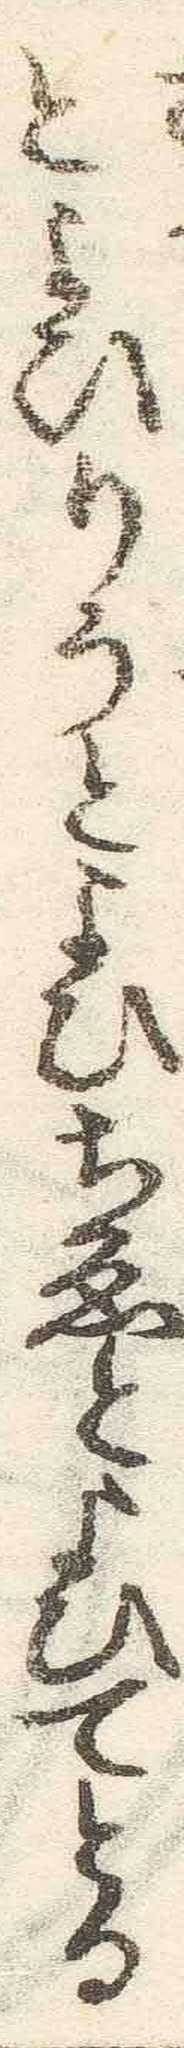とよひりうとよひちゑとよひてとる
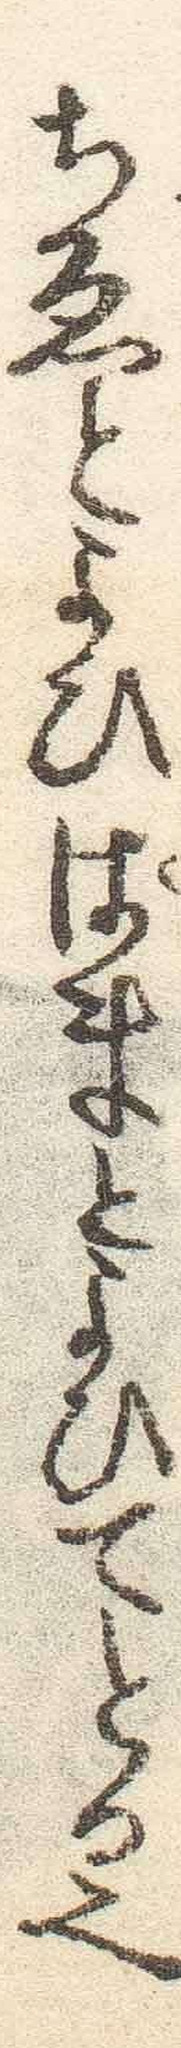ちゑとよひぱまとよひてとる也
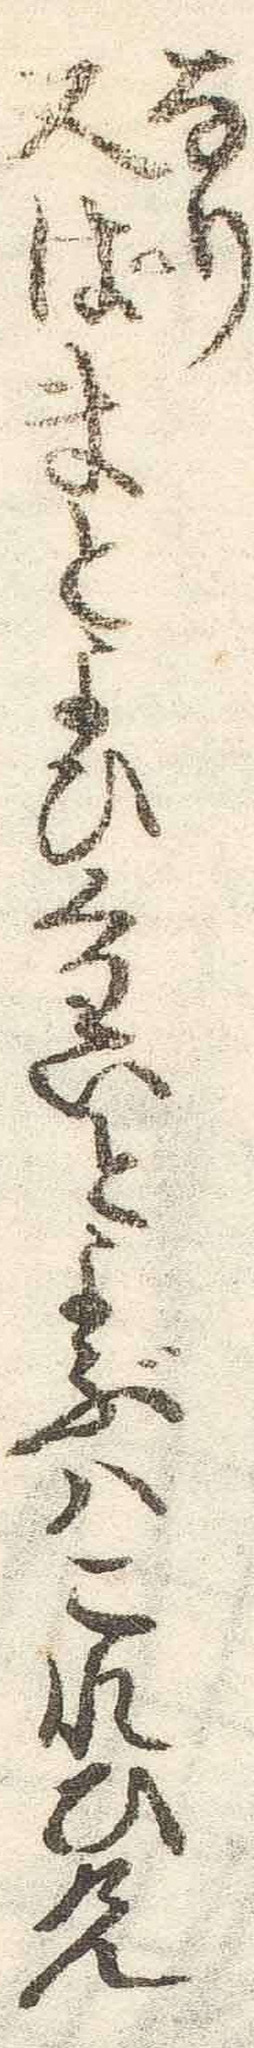又ぱまとよひくわいとよぶはこれひけん
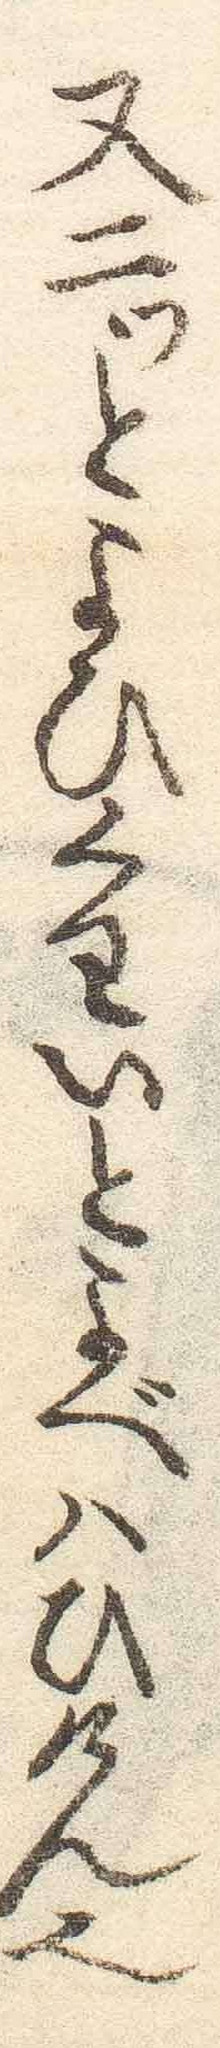又二ッとよひくわいとよべはひけん也
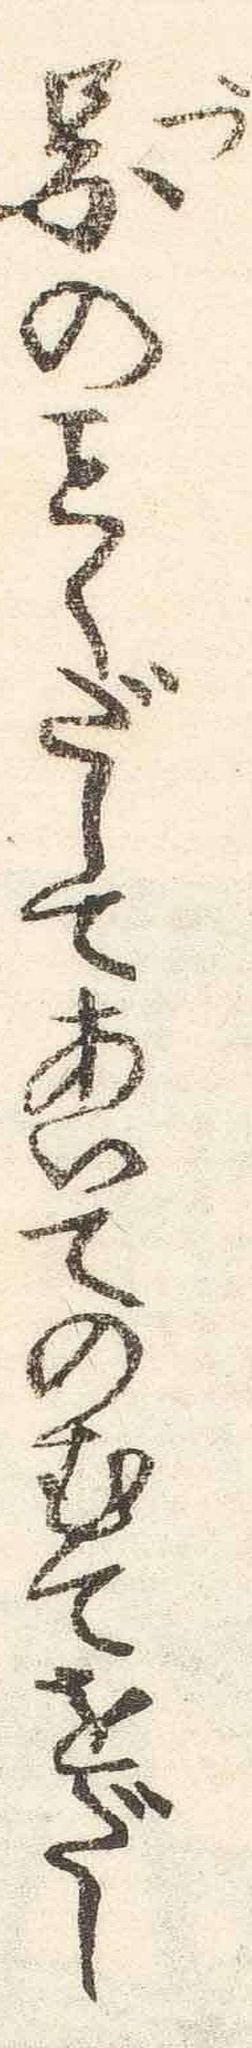図のことくだしてあいてのむてをだし
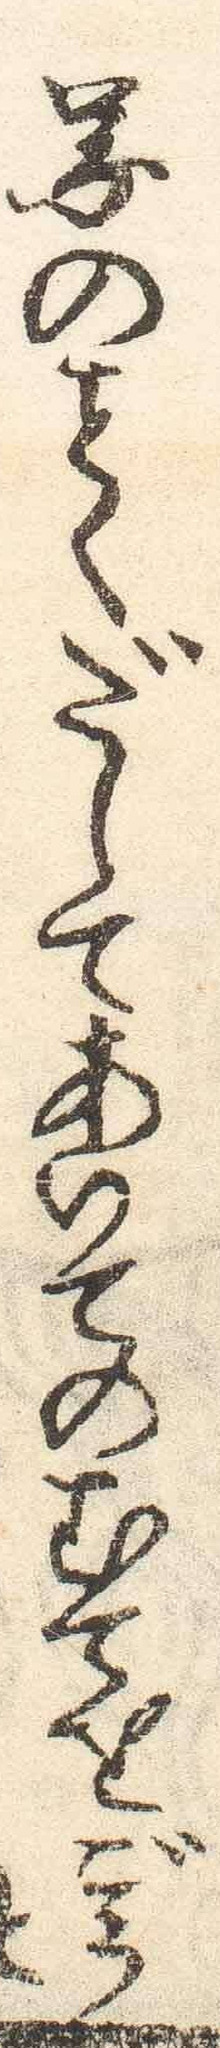図のことくだしてあいてのむてをごうと
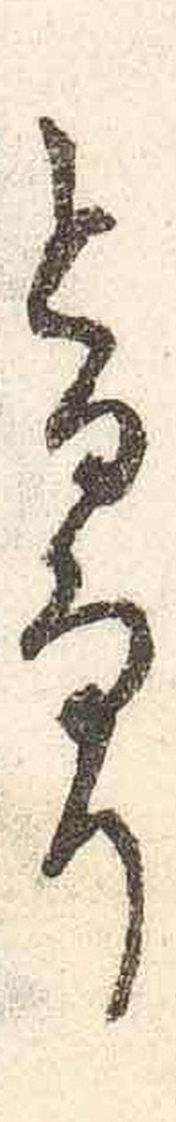とるなり
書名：拳独稽古
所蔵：東京学芸大学附属図書館 国文学研究資料館
